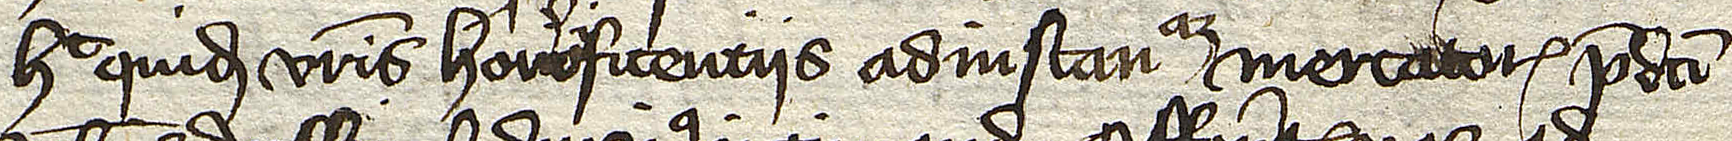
H*c quid* v*ris hono*ficentiis ad inſtan* Mercator* p*dic*
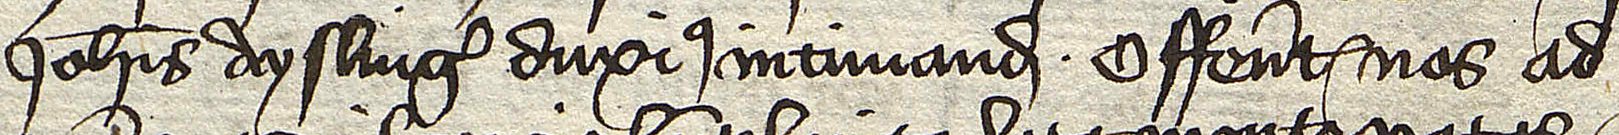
Ioh*is Ayſling* duxi* intimand* . Offe*nt* nos ad
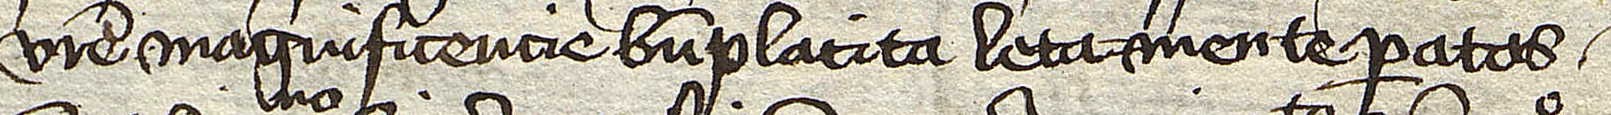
v*re magnificencie b*n*placita leta mente p*atos /
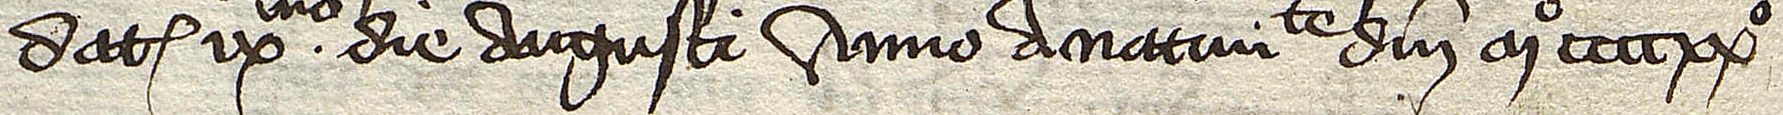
Dat* ix* . die Auguſti Anno A natiui*te d*ni M*ccccxx*
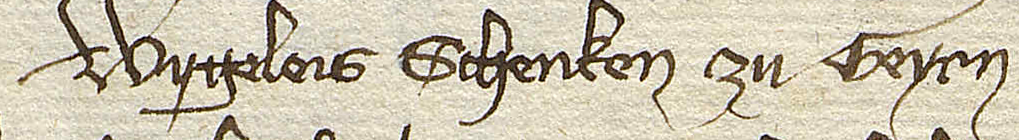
Wygeleis Schenken ʒu Geyrn
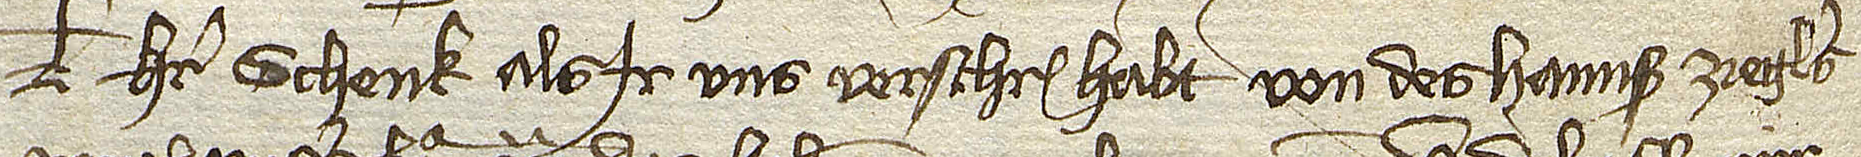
L* hr* Schenk als Ir vns verſchr* habt von des hannſ* ʒiegl*s
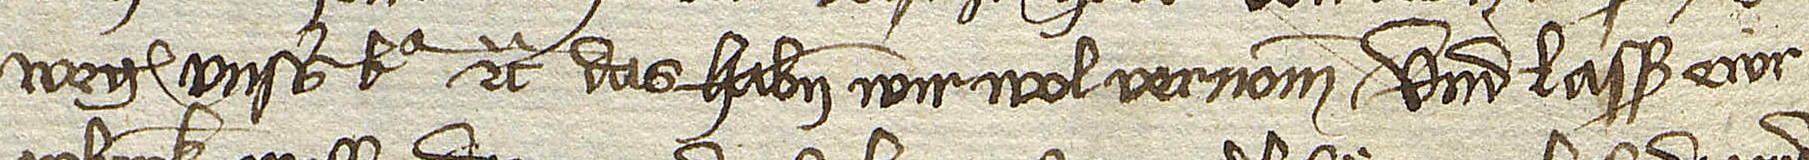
weg* vnſ*s b* ec* das habn* wir wol vernom* / Vnd laſſ* eẅr
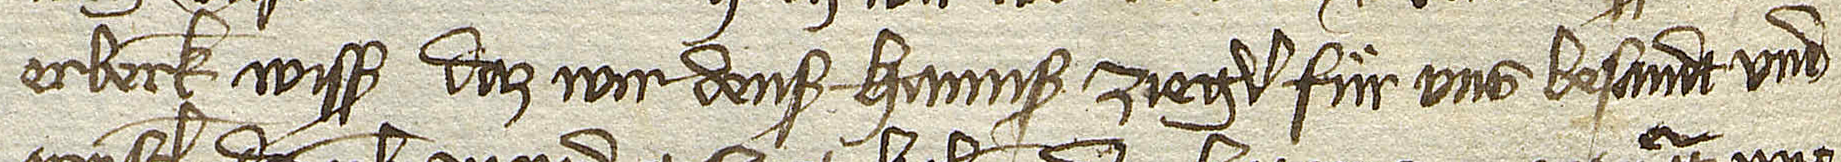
erberk* wiſſ* daʒ wir denſ* hannſ* ʒiegl* für vns beſandt vnd
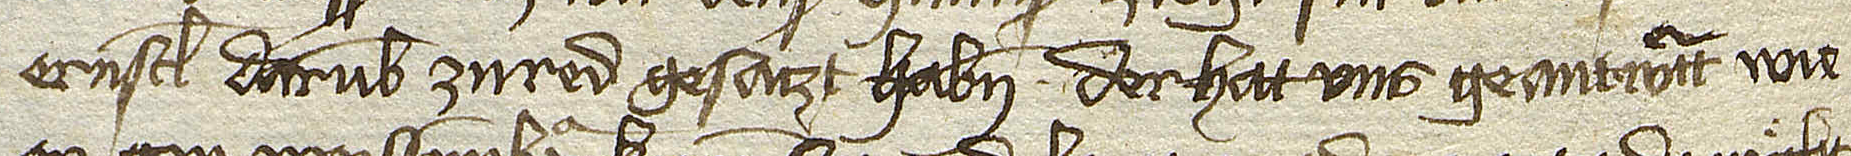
ernſtl* darub* ʒured geſacʒt habn* / Der hat vns geantw*tt wie
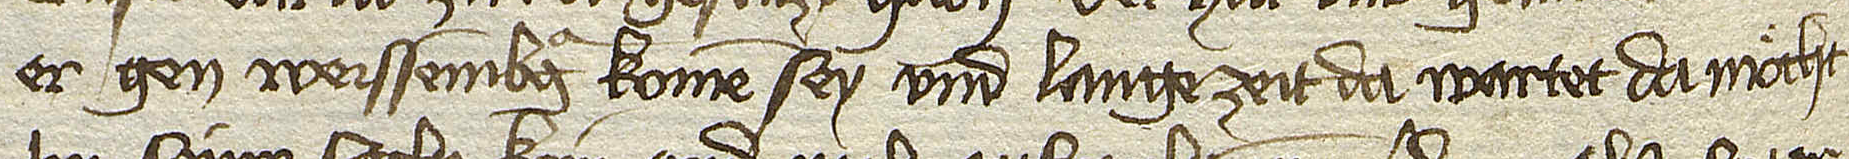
er gen weiſſemb*g kome* ſey vnd lange ʒeit da wartet da möcht
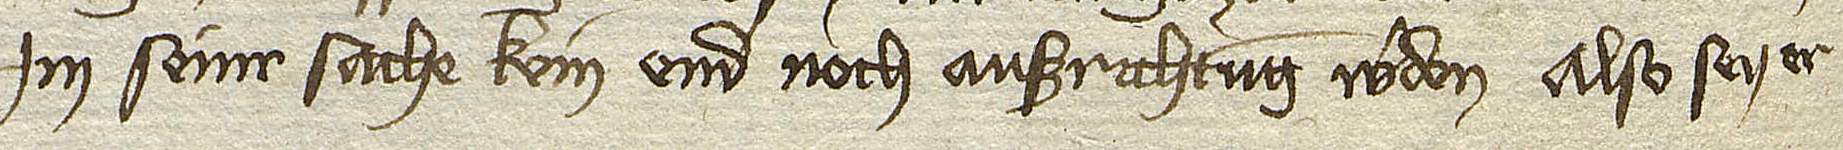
Im ſeinr ſache kein end noch auſʒrichtu*g w*den Alſo ſey er
